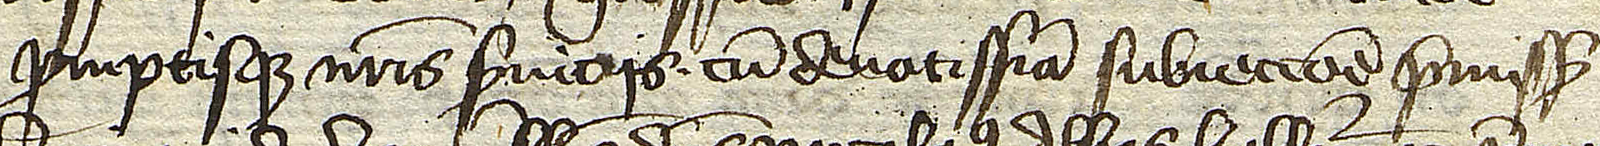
p*mptiſq* n*ris ſ*uiciis . cu* deuotiſſi*a ſubiect*o*e p*miſſ*
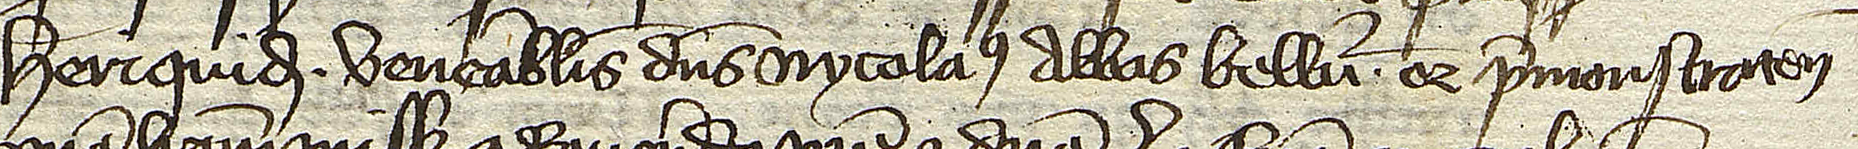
Heri quid . vene*ab*lis d*n*s Nycola* Abbas Belbu* et p*monstraten*
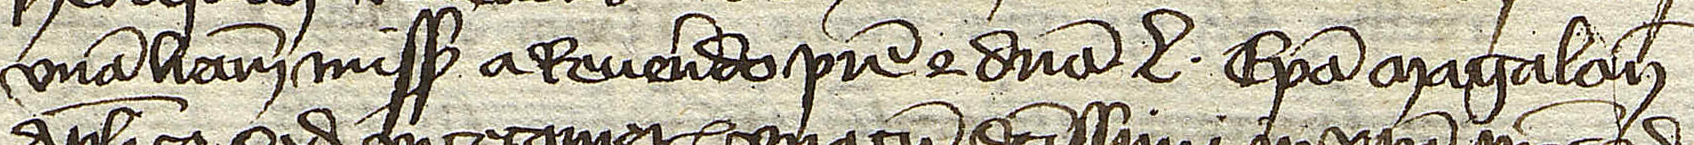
vna* l*ram miſſ* a Reu*ndo p*re @ d*no L . Ep*o Magalon*
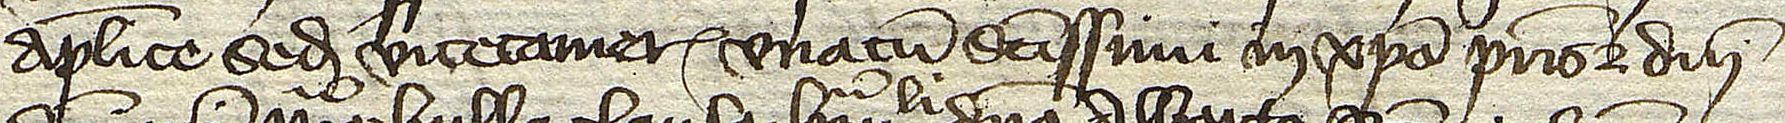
Ap*lice Sed* vicecamer* vnacu* S*c*iſſimi in xpo* p*ris @ d*m*i
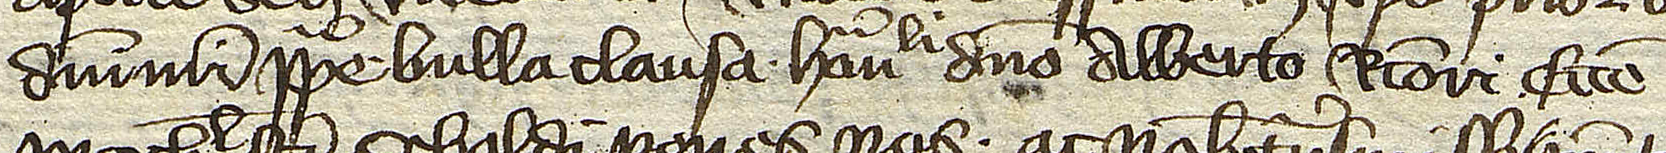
d*ni n*ri p*pe bulla clauſa . hon* d*no Alberto R*c*ori Ecc*e
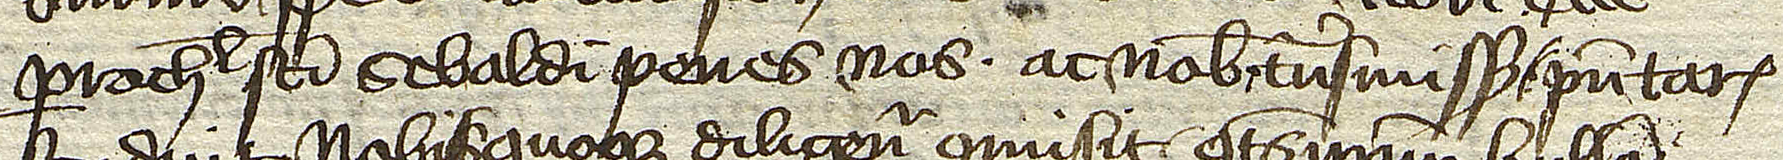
p*roch*l* ſ*c*i Sebaldi penes nos . ac nob* t*nſmiſſ* p*ntar*
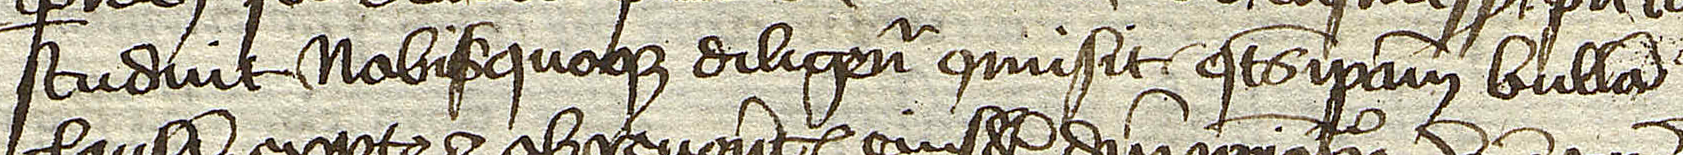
ſtuduit Nobiſquoq* diligen* *miſit / q*t*s ip*am bulla*
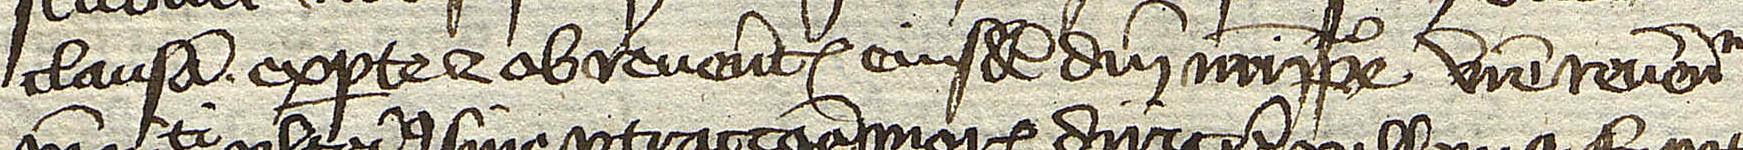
clauſa* ex p*te @ ob reue*nt* eiuſde* d*ni n*ri p*pe . v*re reue*n
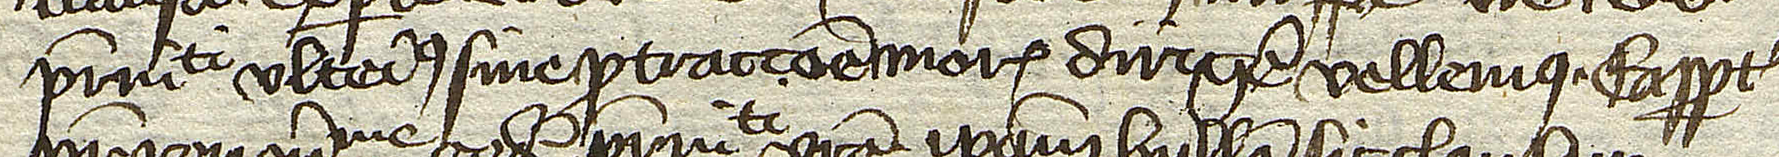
p*rn* vlte*i* ſiue p*tract*o*e mor* dirige* vellem* . Eap*pt*
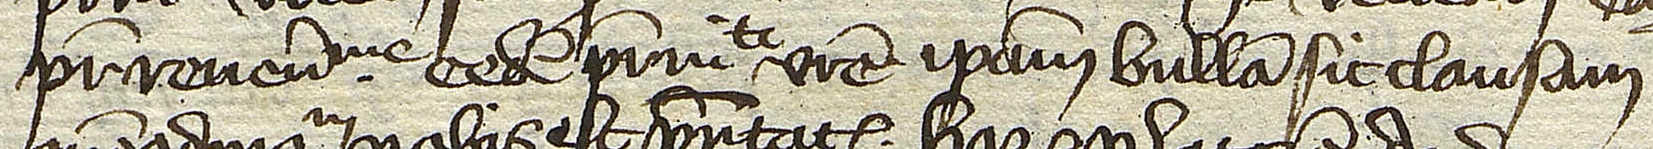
p*r reue*n*me . ead* p*rni* v*re ip*am bulla* ſic clauſam
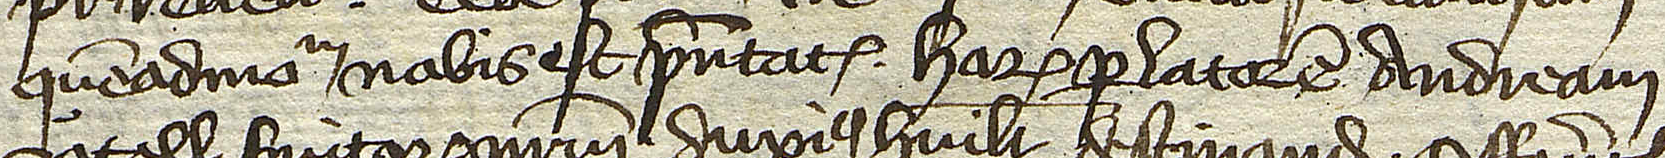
que*admo* nobis eſt p*tat* . Har* p*lator e* Andream
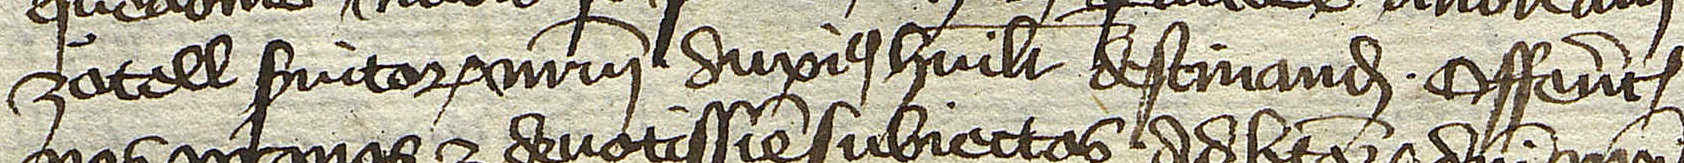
Ʒöttel ſ*uitor* n*r*m duxi* hu*il*r deſtinand* . Offe*nt*
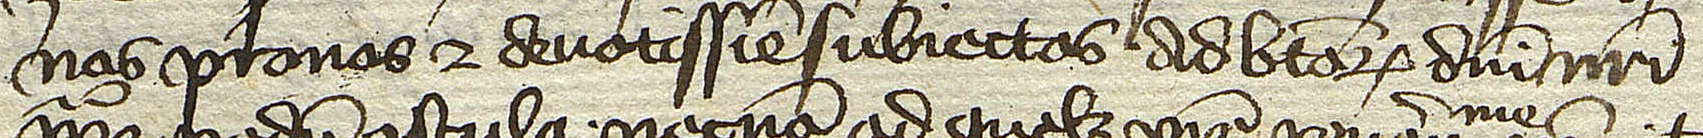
nos pronos @ deuotiſſi*e ſubiectos Ad b*to* d*ni n*ri
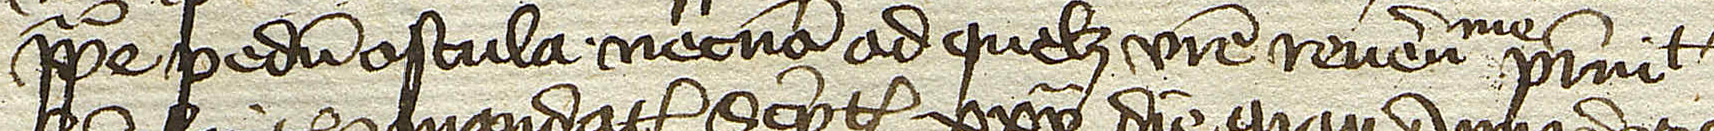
p*pe pedu* oſcula . necno* ad que*l* v*re reue*n* p*tat*
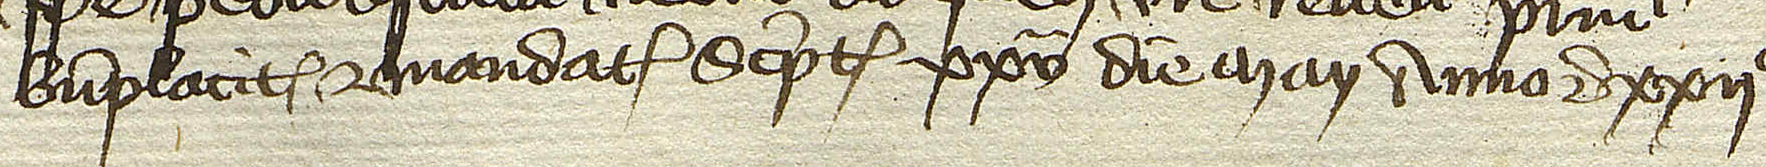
b*n*placit* @ mandat* . Sc*pt* xxv die May Anno ec* xxii*
